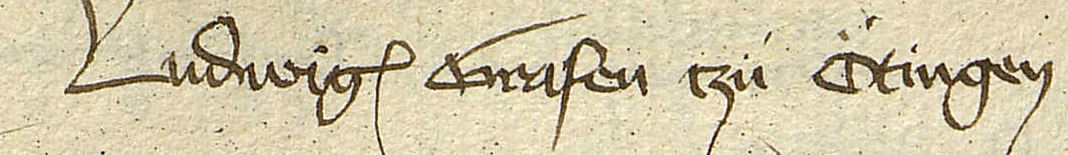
Ludwig* Grafen cʒü Ötingen
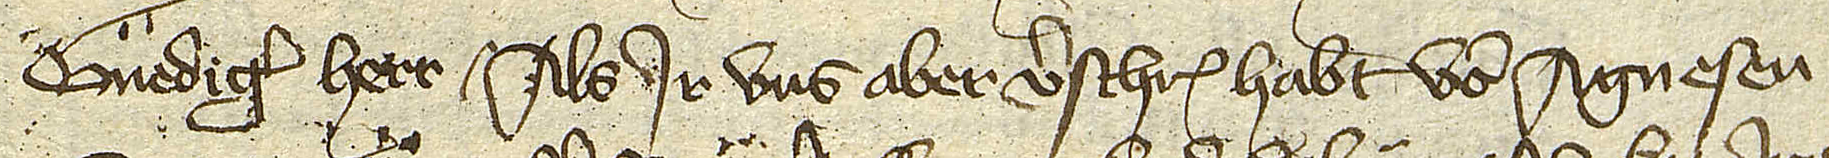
Gnedig* herr / Als Ir vns aber v*ſchr* habt vo* Agneſen
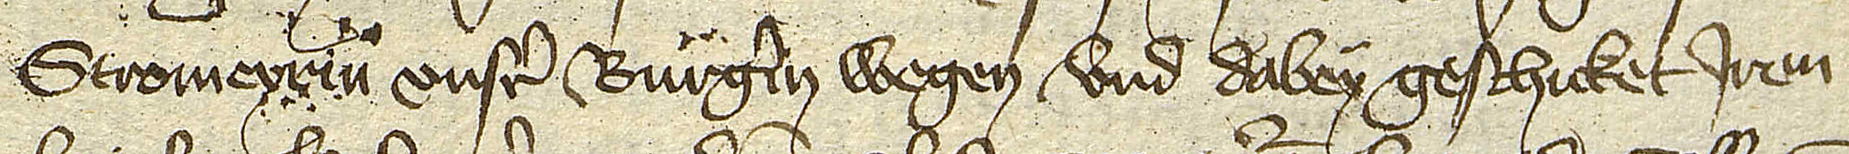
Stromeyrin vnſr* Burg*in wegen / vnd dabey geſchicket Iren
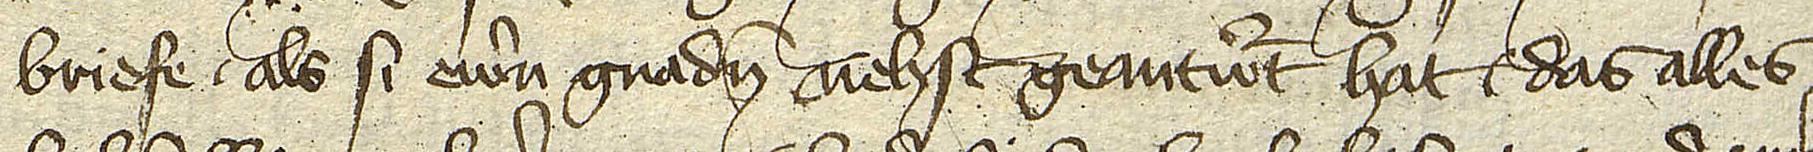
briefe / als ſi ew*n gnadn* nehſt geantwt* hat / das alles
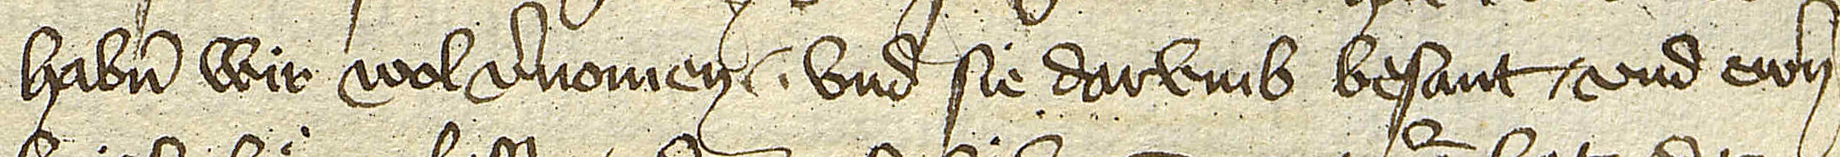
habn* wir wol v*nomen / . vnd ſie darvmb beſant / vnd ew*n
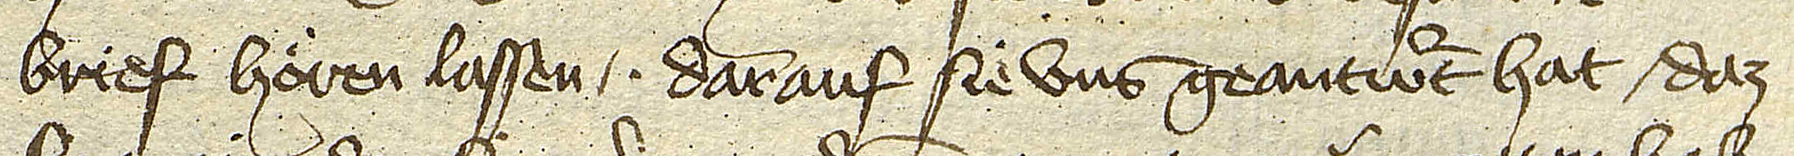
brief hören laſſen / . darauf ſie vns geantwt* hat / daʒ
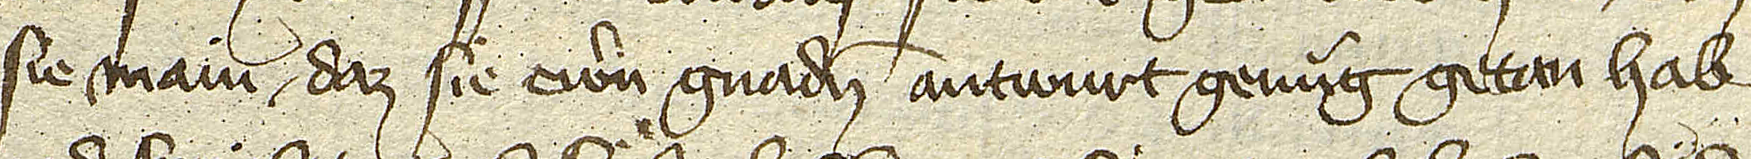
ſie main / daʒ ſie ew*n gnadn* antwurt genüg getan hab
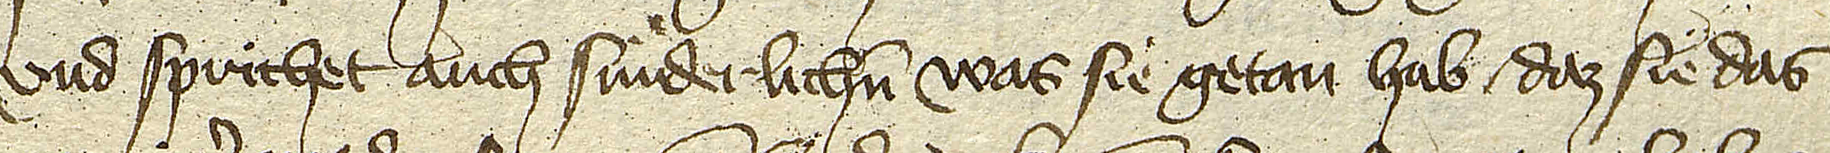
vnd ſprichet auch ſünderlichn* was ſie getan hab / daʒ ſie das
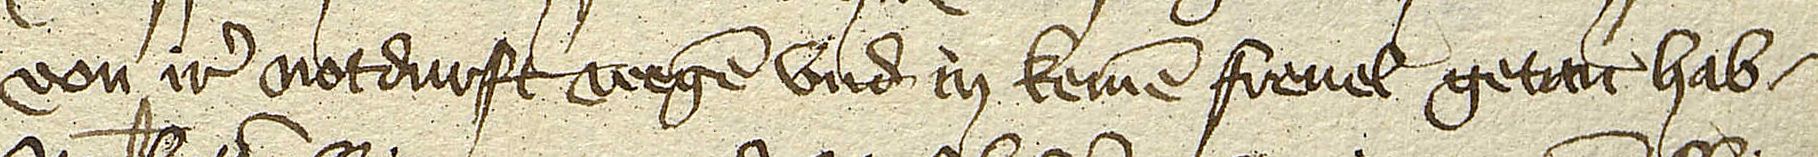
von ir* notdurft wege* vnd in keine* freuel getan hab /
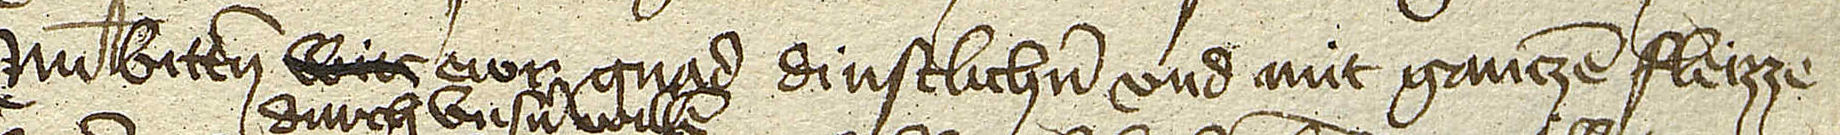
Nu bittn* wir ewr gnad dinſtlichn* vnd mit gancʒe* fleiʒʒe
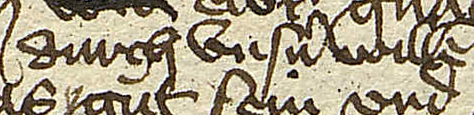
durch vnſn* wille*
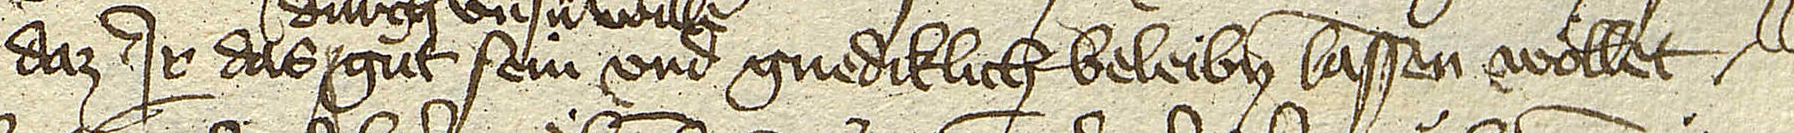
daʒ Ir das gut ſein vnd gnediklich beleibn* laſſen wöllet /
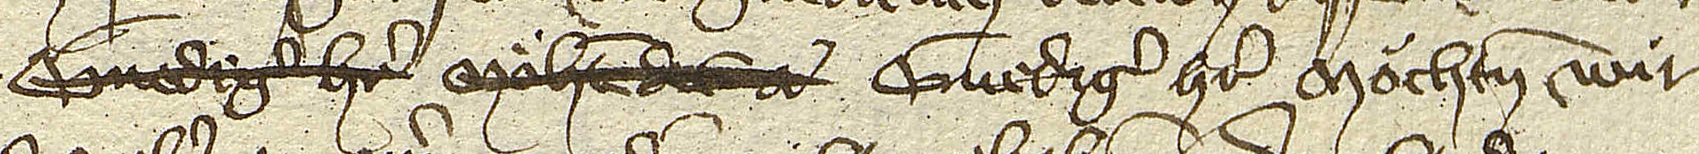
Gnedig* hr* Möhte* des a Gnedig* hr* Möchtn* wir
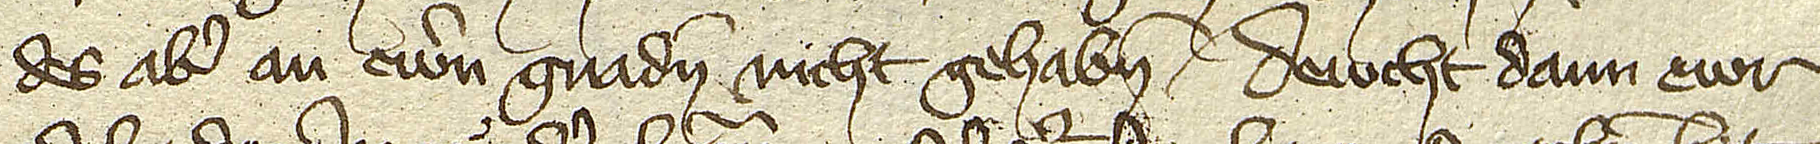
des ab* an ew*n gnadn* nicht gehabn* / Dewcht dann ewr
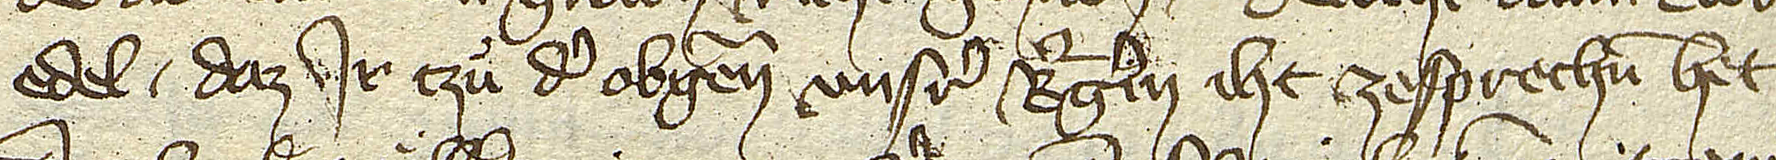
edel / daʒ Ir cʒü d* obgen* vnſr* B*g*in iht cʒeſprechn* het
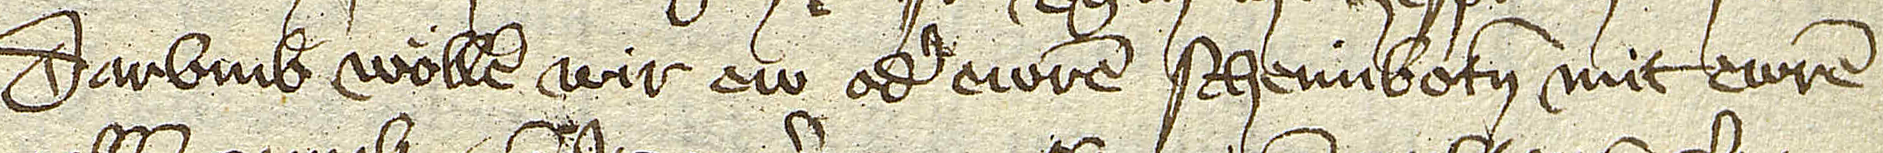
Darvmb wölle* wir ew od* ewre* ſcheinbotn* mit ewre*
